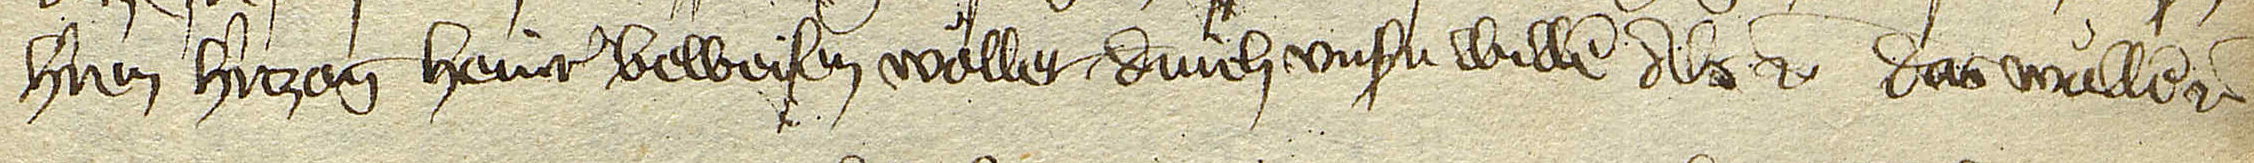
h*ren h*rcʒog heinr* beweiſen wöllet / durch vnſ*n wille* Als ec* das wölle* ec*
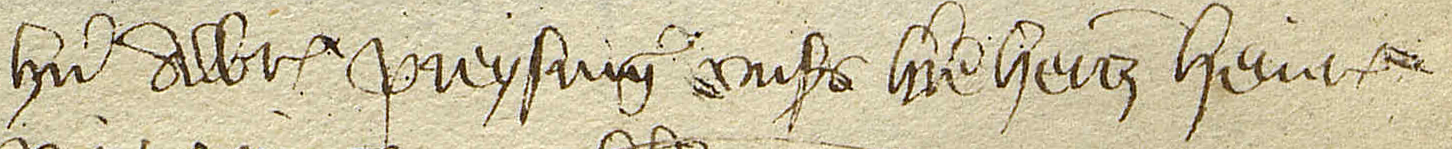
hn* Albr* Preyſing* vnſ*s h*re* hercʒ* heinr*
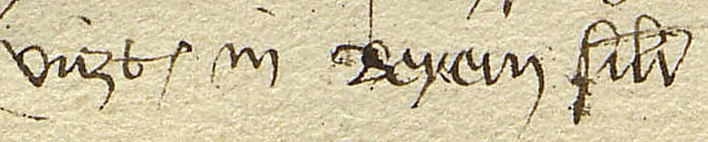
vicʒt* in Beyern ſilr*
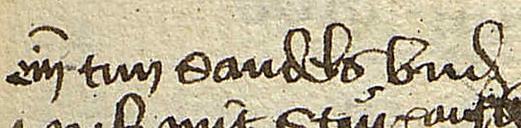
ein* tun Sandels vnd
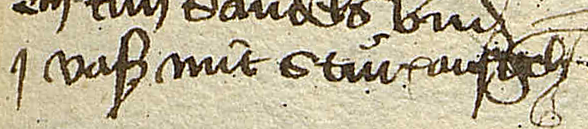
i vaſʒ mit Stür* aufgeh*
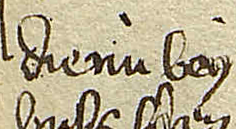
die nu bey
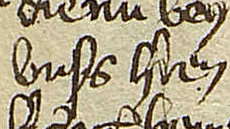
vnſ*s h*ren
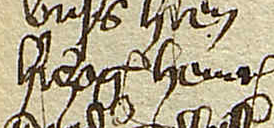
h*rcʒog* heinr*
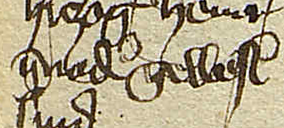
gnad* geweſe*
